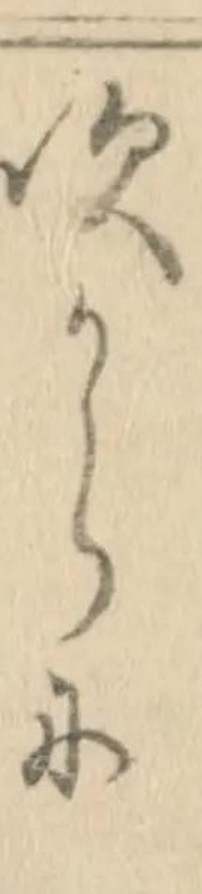吹からに
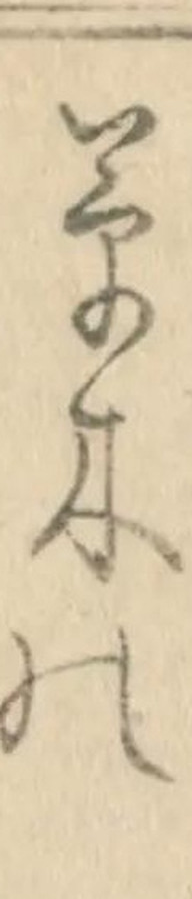草木の
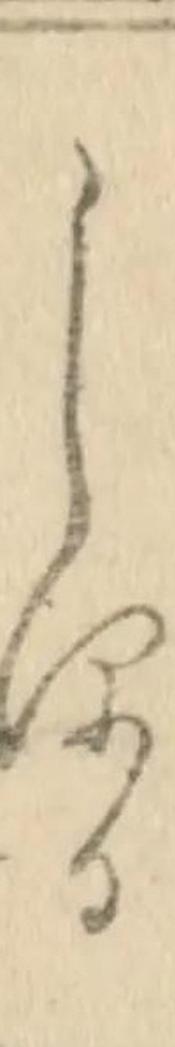しほる
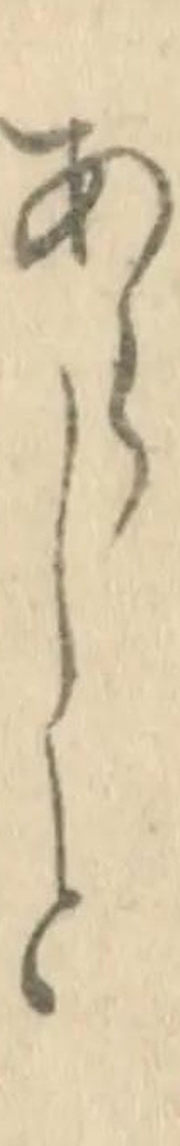あらしと
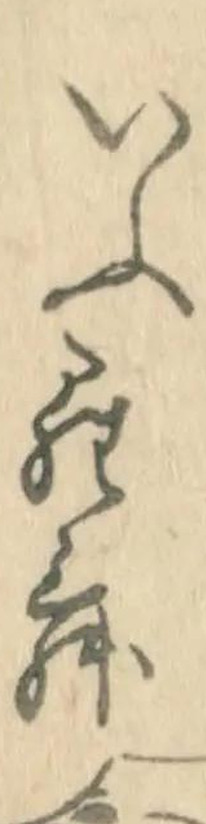いふらむ

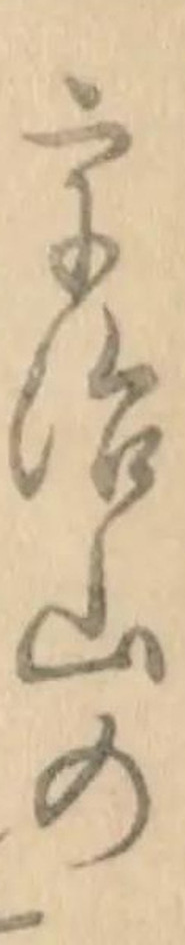宇治山の
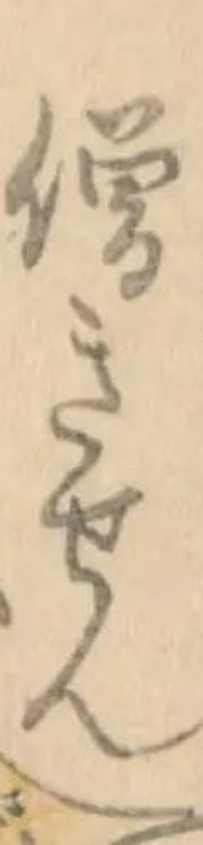僧きせん
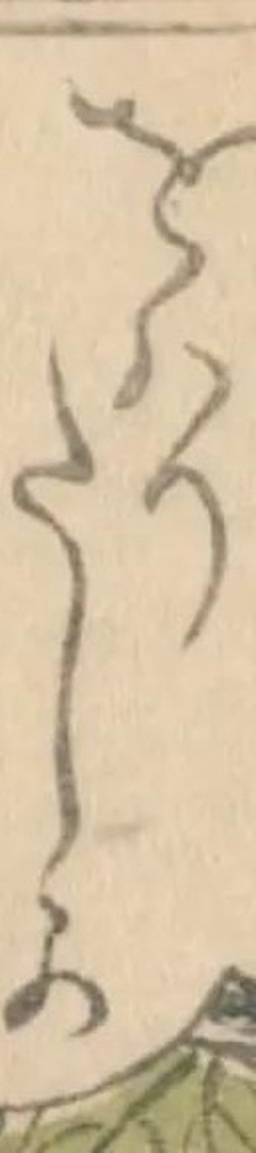たしか
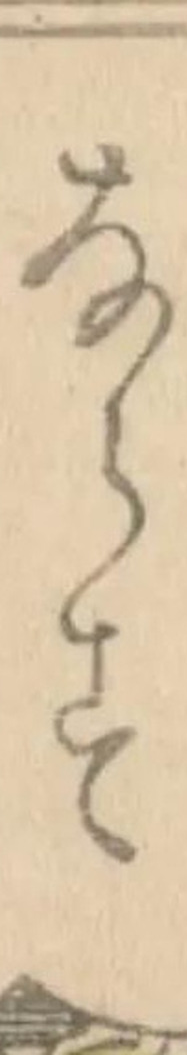ならす
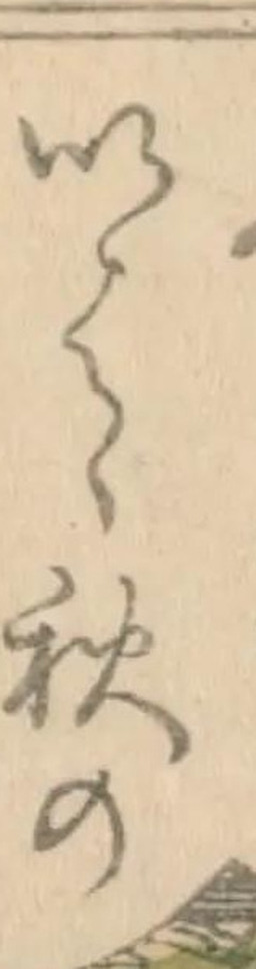いはゝ秋の
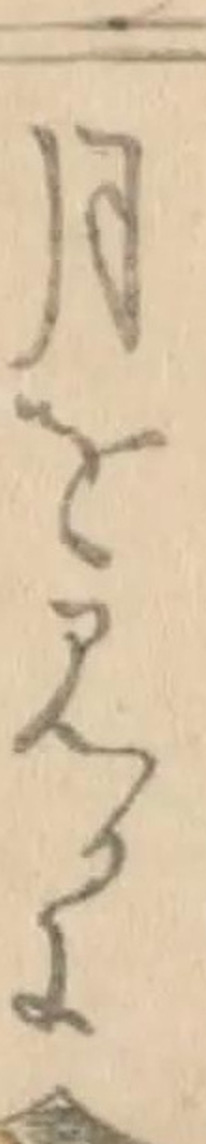月を見るに
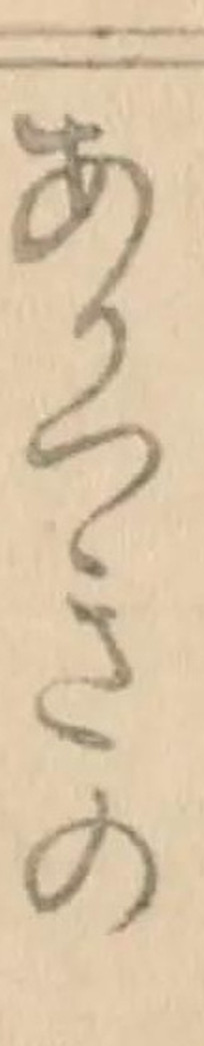あかつきの
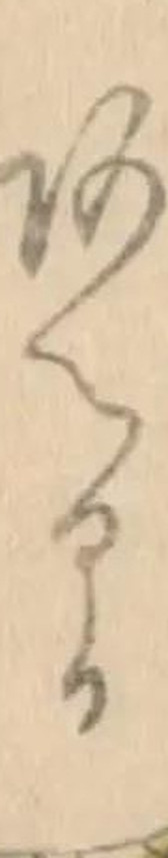あへるか
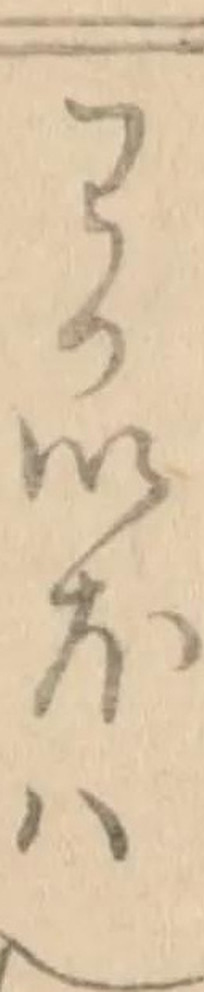わかいほは
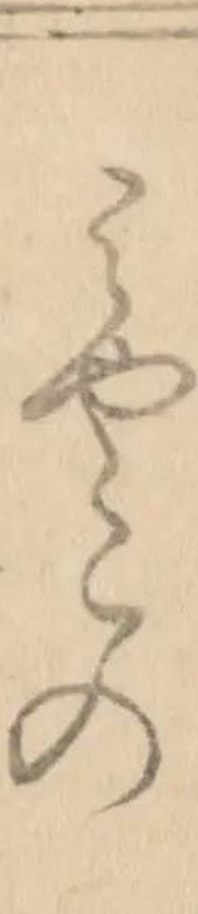みやこの
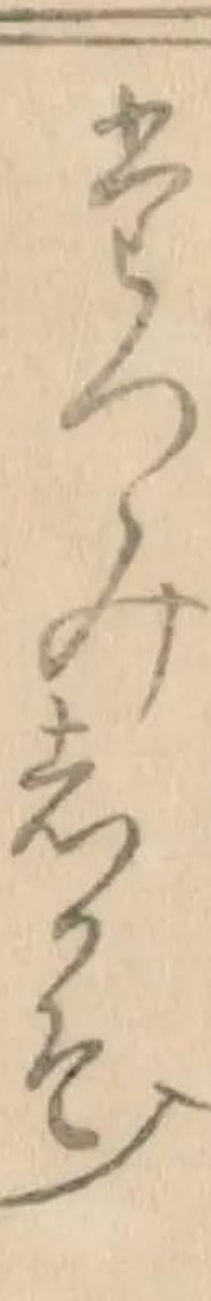たつみしかそ
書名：錦百人一首あつま織
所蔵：国立国会図書館 National Diet Library, JAPAN
